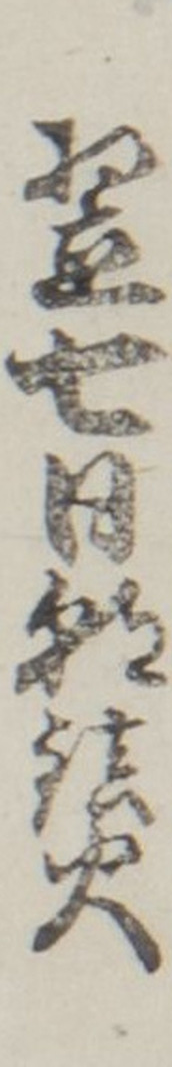翌七日朝鎮火
